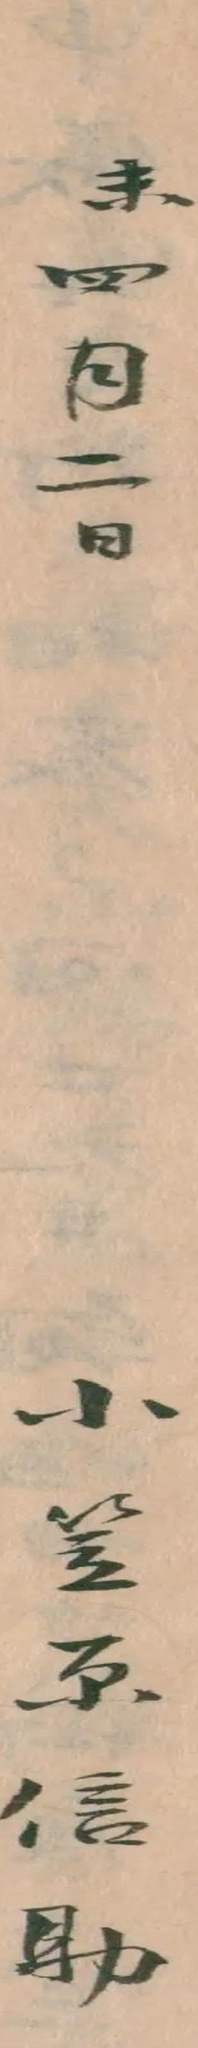未四月二日小笠原信助
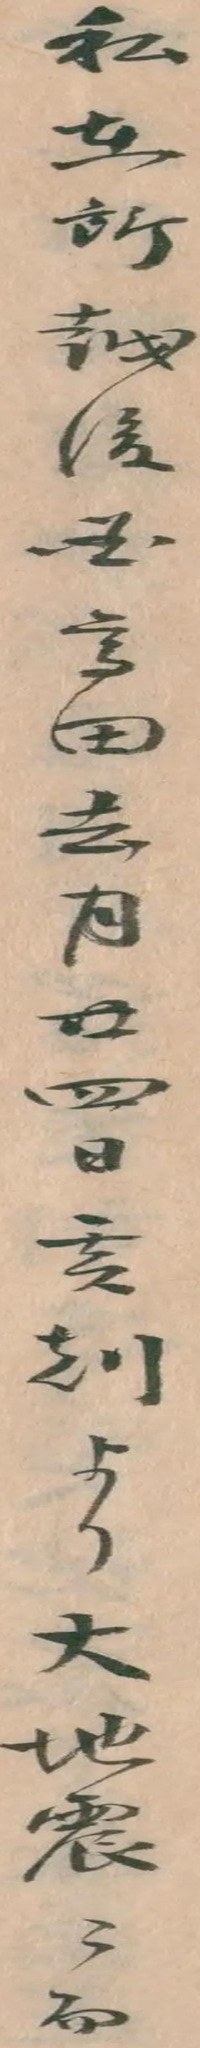私在所越後国高田去月廿四日亥刻ゟ大地震二而
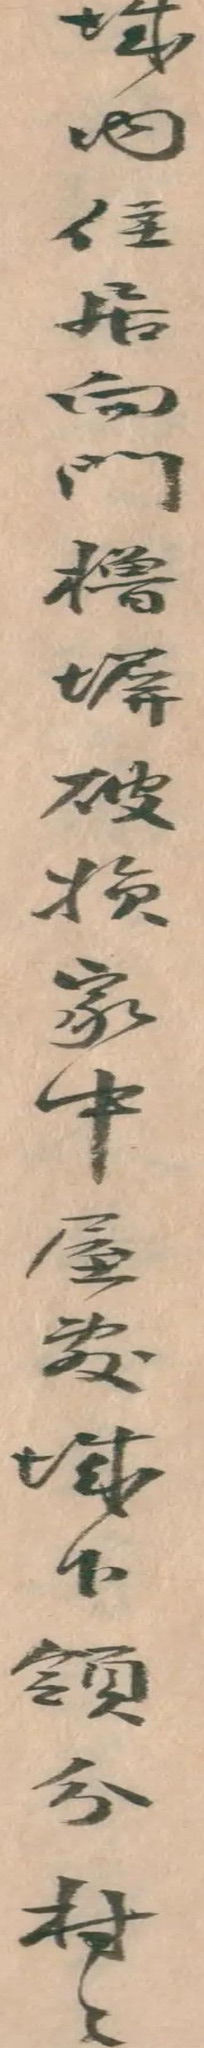城内住居向門櫓塀破損家中屋敷城下領分村々
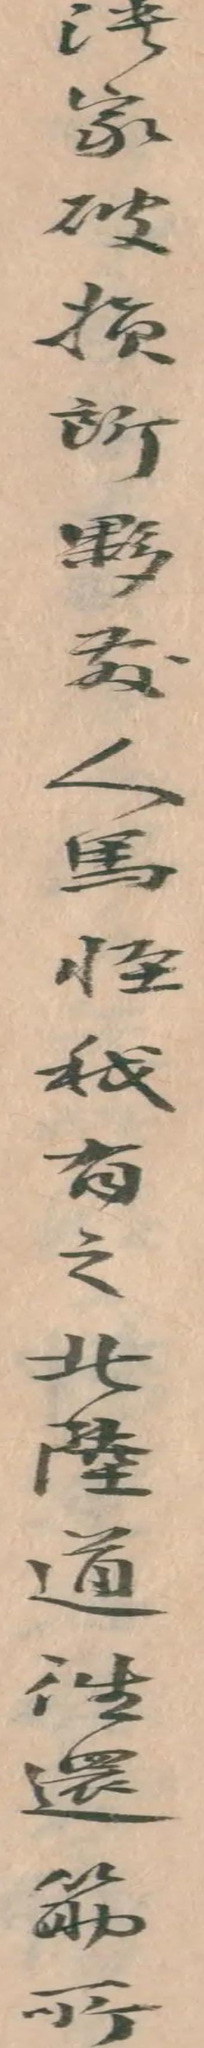潰家破損所夥敷人馬怪我有之北陸道往還筋所
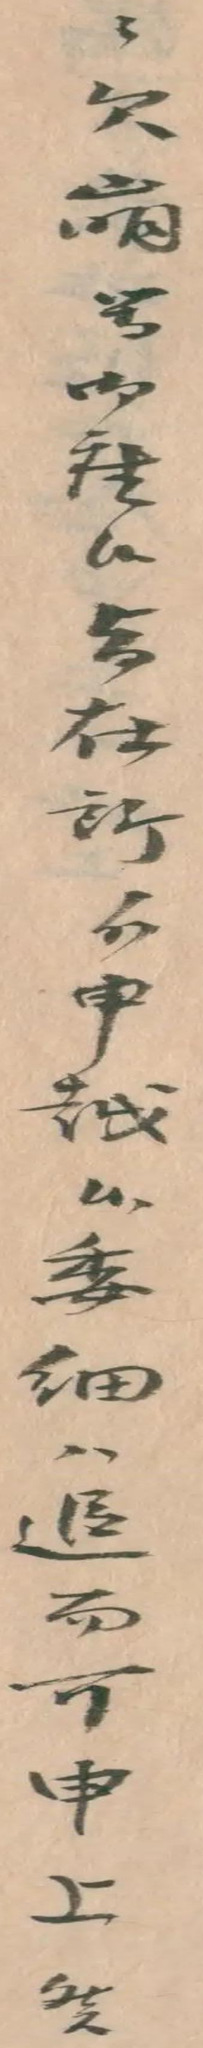々欠崩等御座候旨在所二而申越候委細ハ追而可申上候

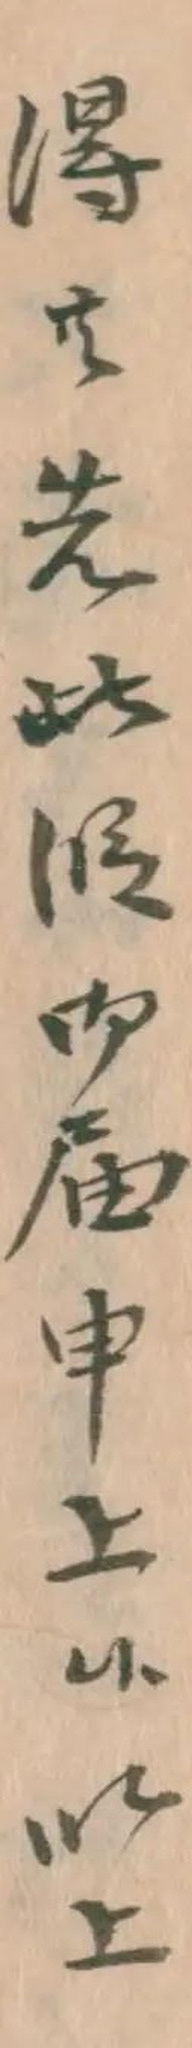得共先此段御届申上候以上
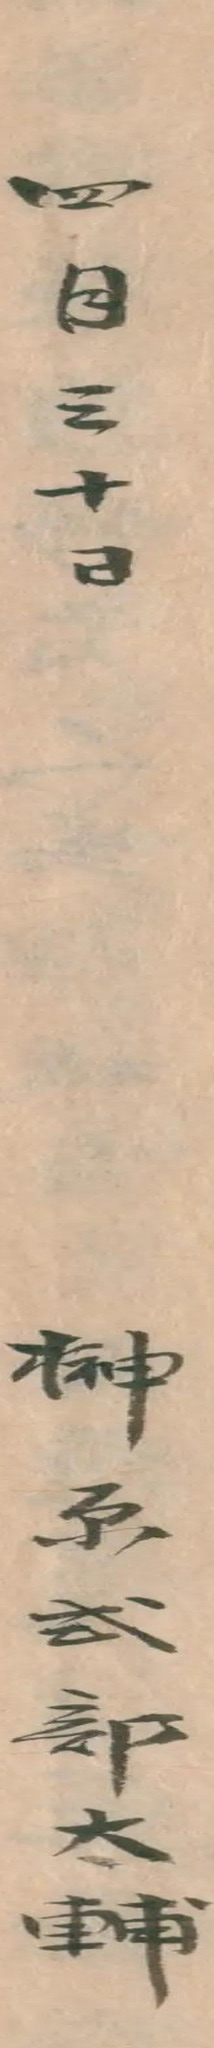四月三十日榊原式部大輔
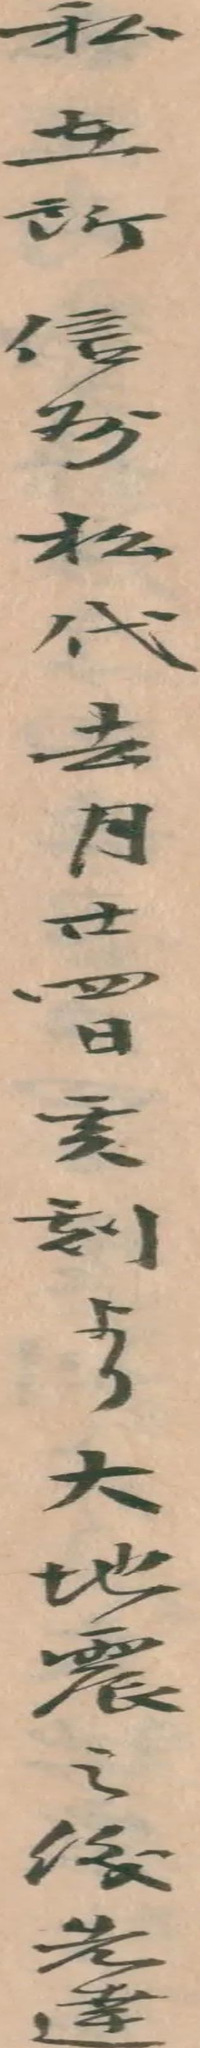私在所信州松代去月廿四日亥刻より大地震之儀先達
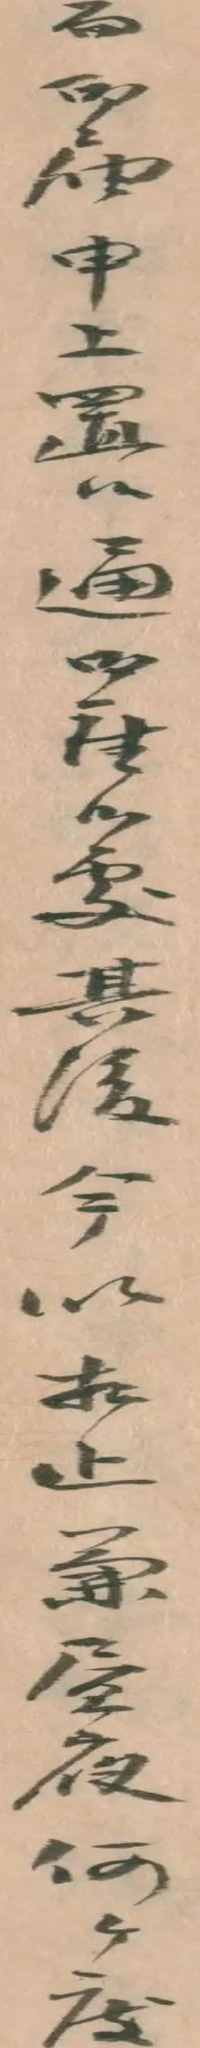而御届申上置候通御座候処其後今以相止兼昼夜何ケ度
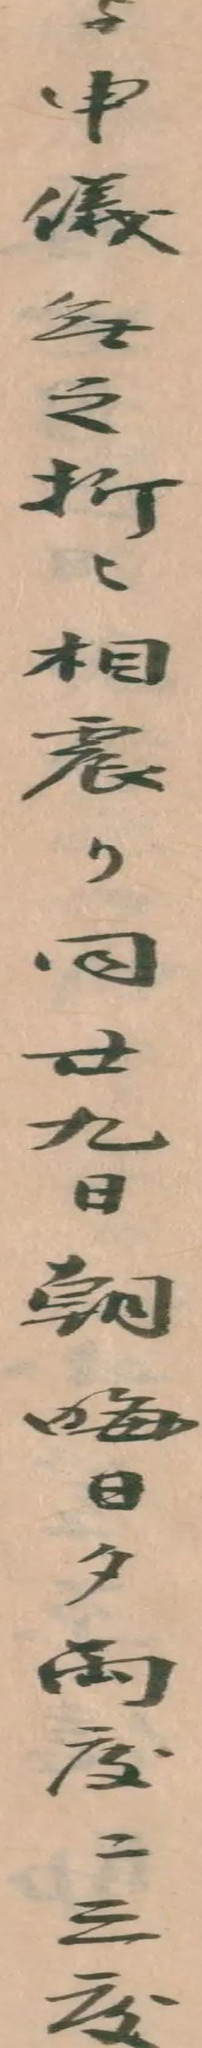と申儀無之折々相震同廿九日朝晦日夕両度ニ三度
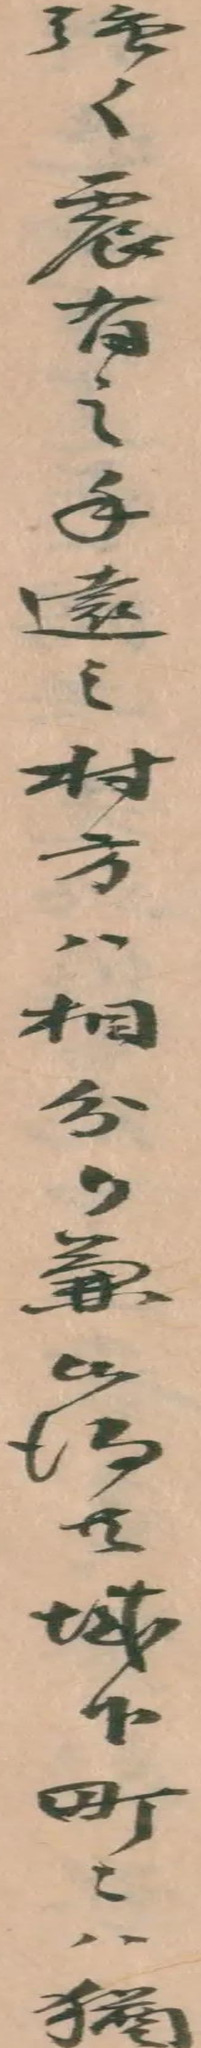強く震有之手遠之村方ハ相分り兼候得共城下町ニハ猶
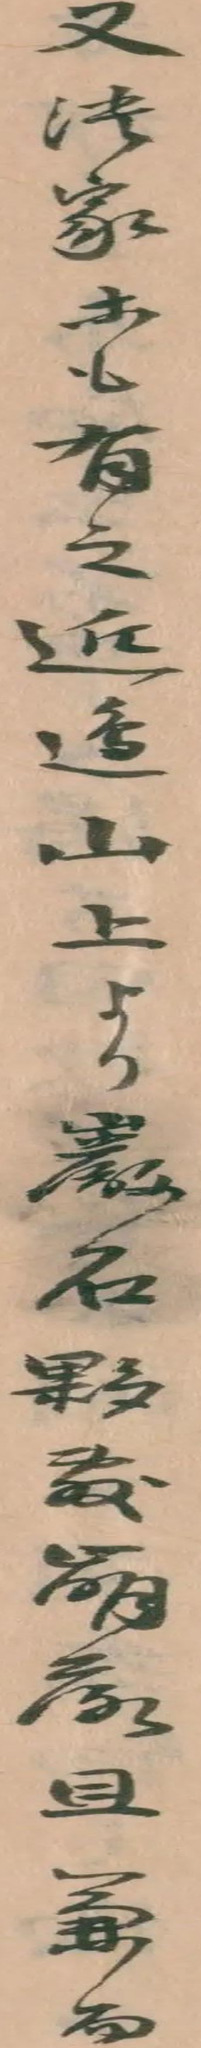又潰家等も有之近辺山上ゟ巌石夥敷崩落且兼而
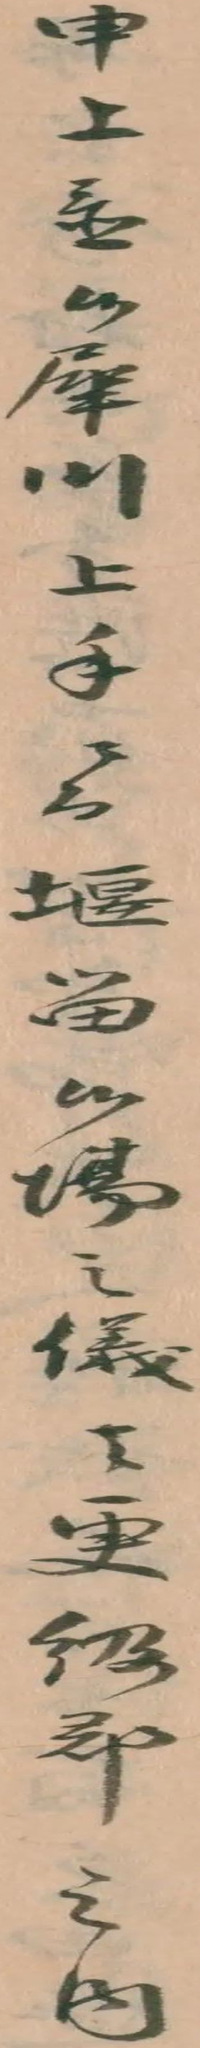申上置候犀川上手ニ而堰留候場之儀者更級郡之内
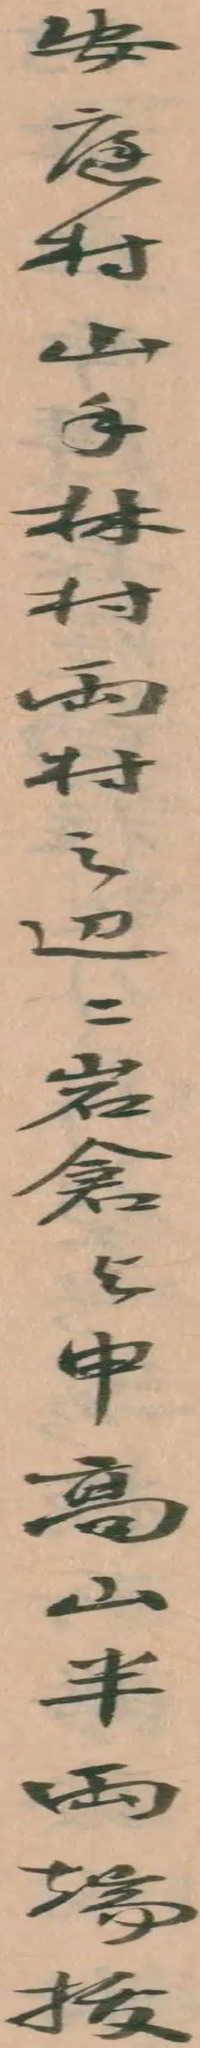安庭村山手林村両村之辺ニ岩倉山と申高山半両端抜
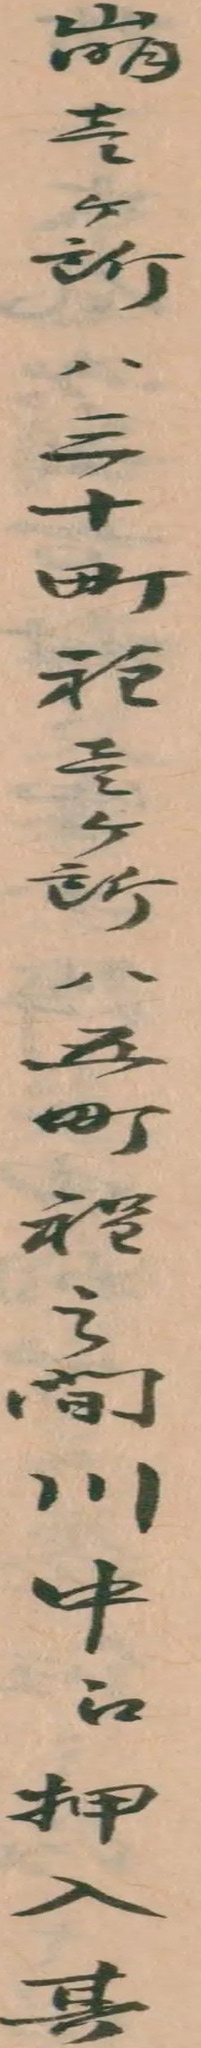崩壱ケ所ハ三十丁程壱ケ所ハ五町程之間川中江押入其
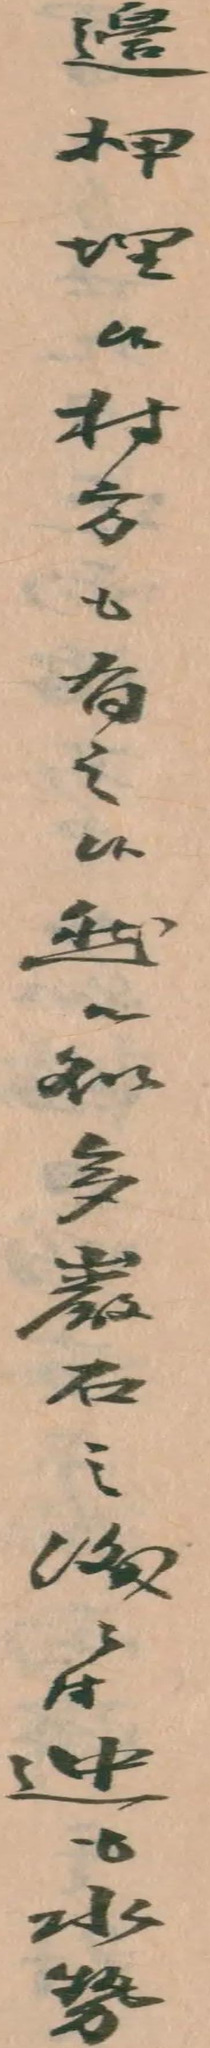辺押埋候村方も有之候然ル処多巌石之儀ニ付迚も水勢
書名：地災撮要. 巻3(地震之部)-巻4(噴火之部)
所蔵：国立国会図書館 National Diet Library, JAPAN
